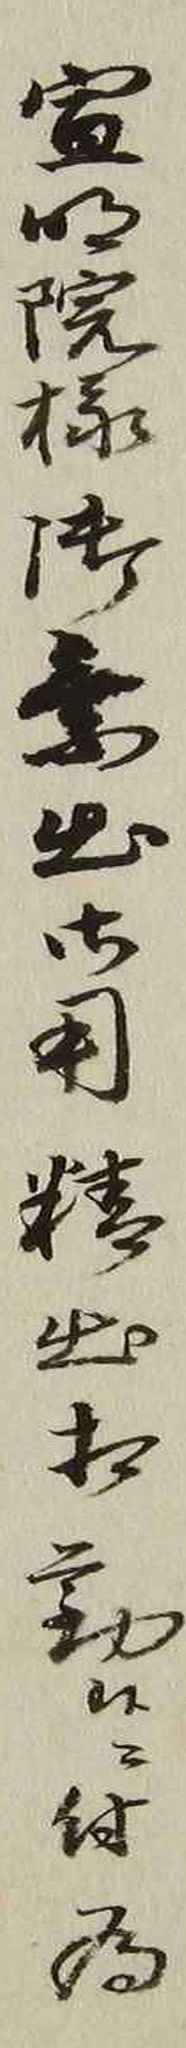宣明院様御乗出御用精出相勤候ニ付為
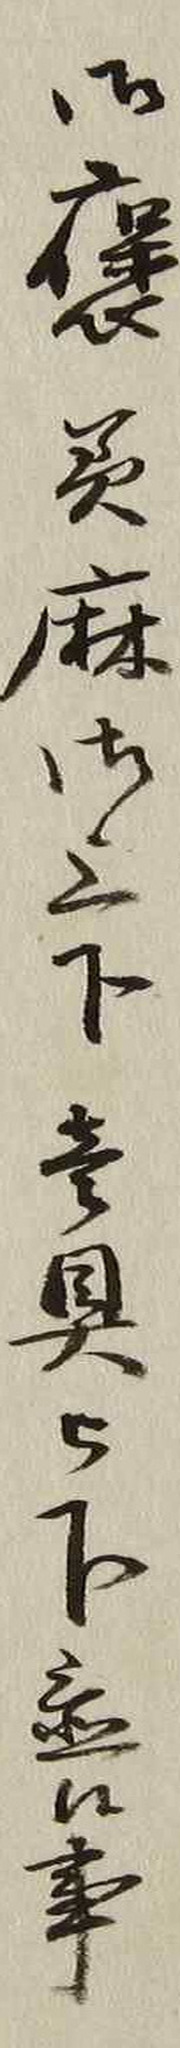御褒美麻御上下壱具被下置候事
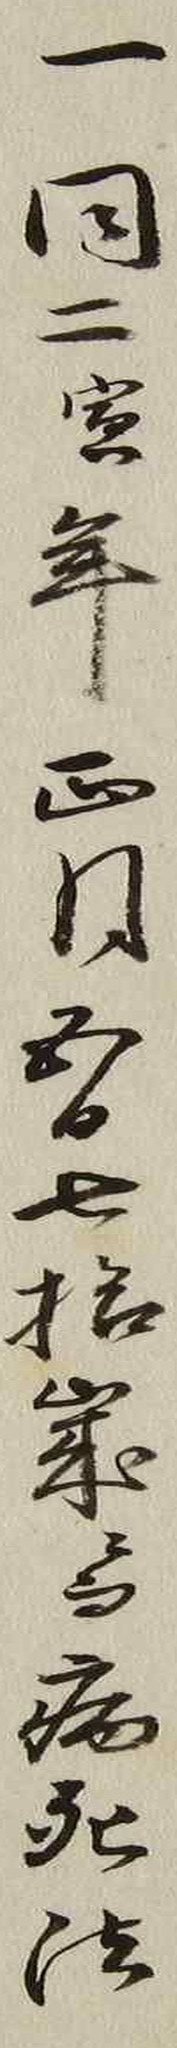一同二寅年正月五日七十歳ニ而病死法
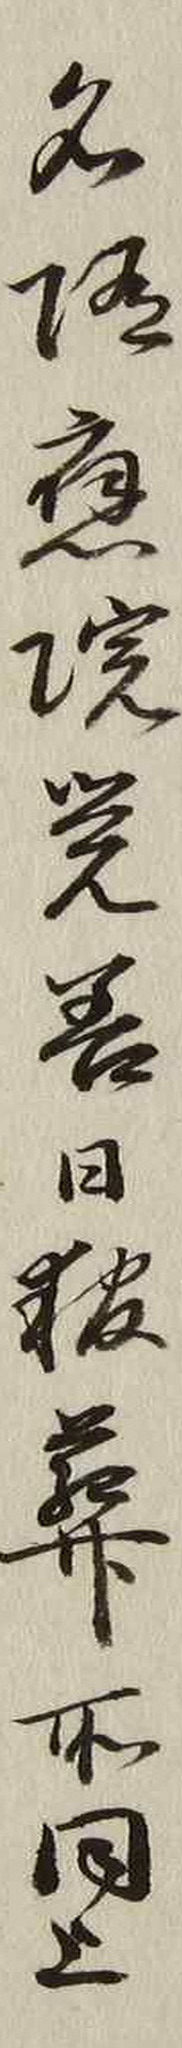名隋應院覚善日披葬所同上
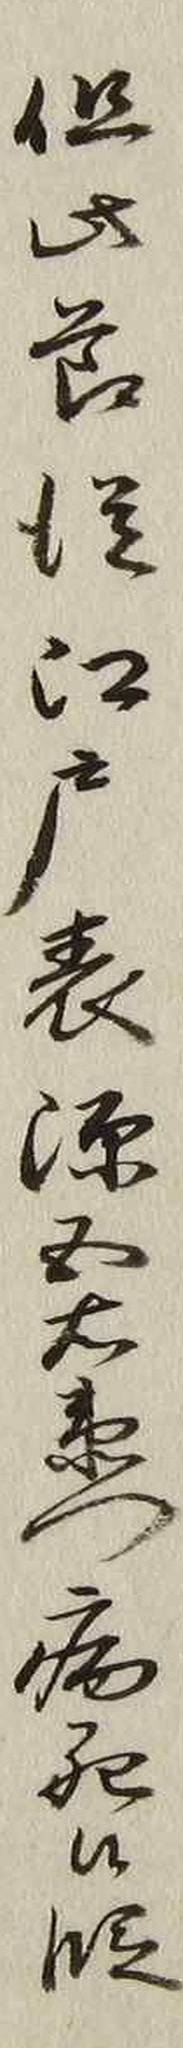但此節従江戸表源五右衛門病死候段
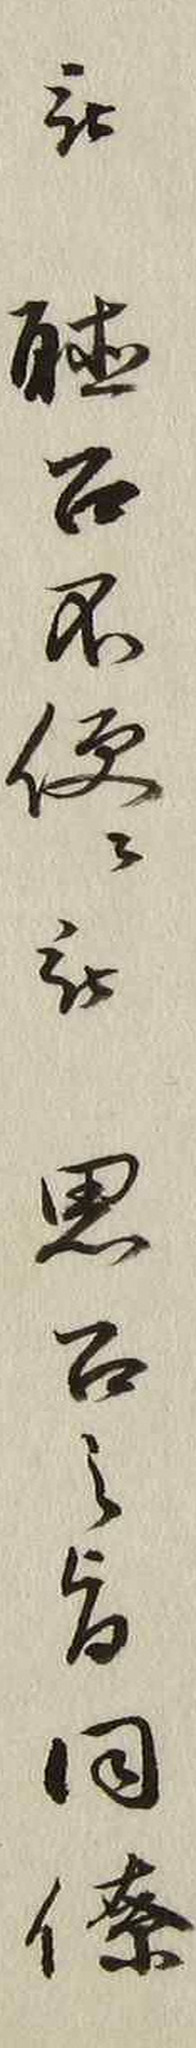被聴召不便ニ被思召之旨同僚
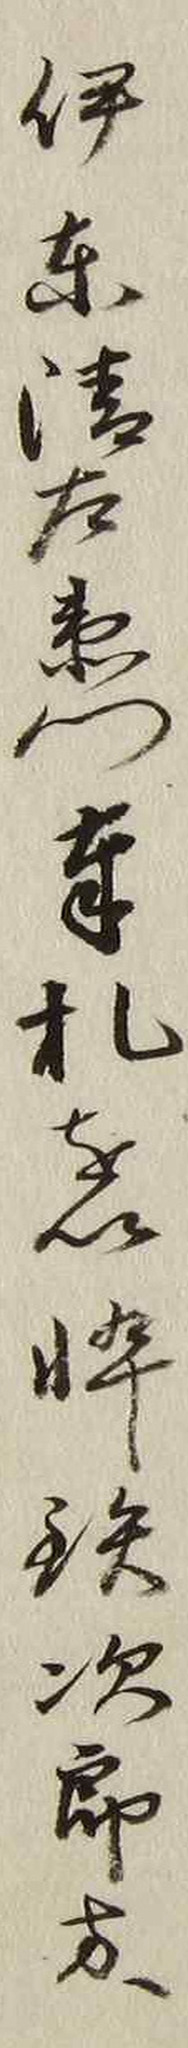伊東清左衛門奉札を以忰鉄次郎方へ
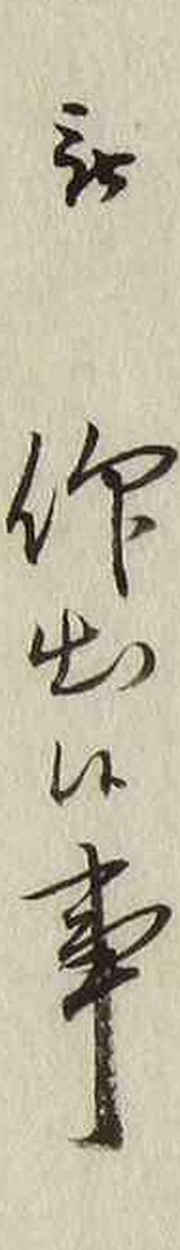被仰出候事
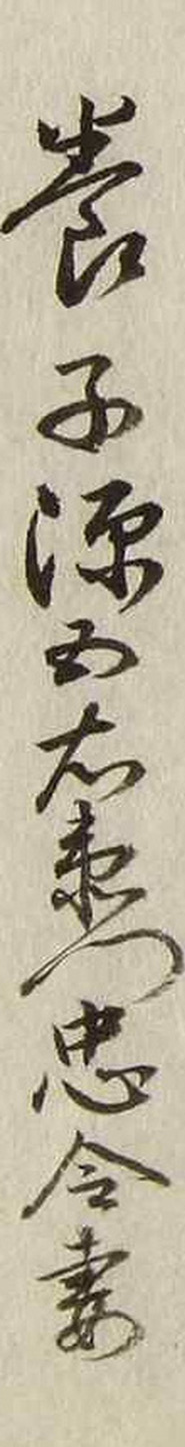女養子源五右衛門忠令妻

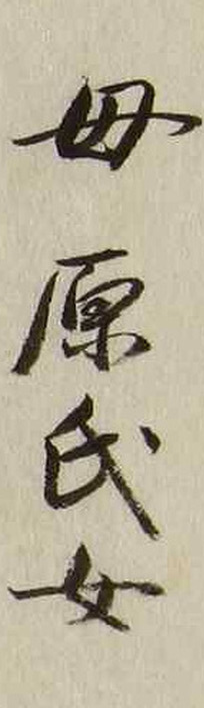母原氏女
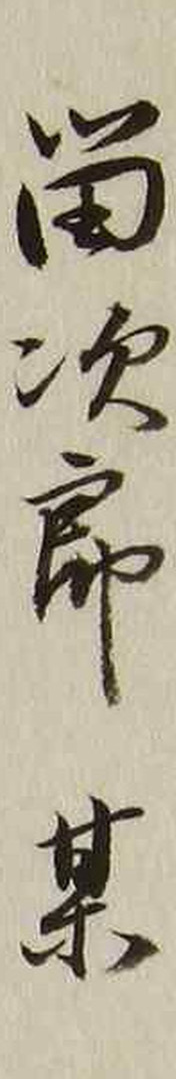留次郎某
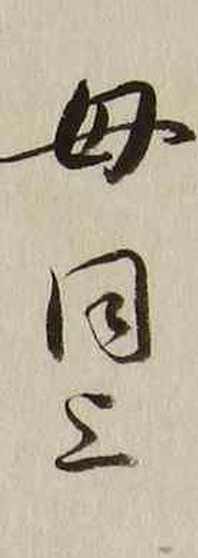母同上
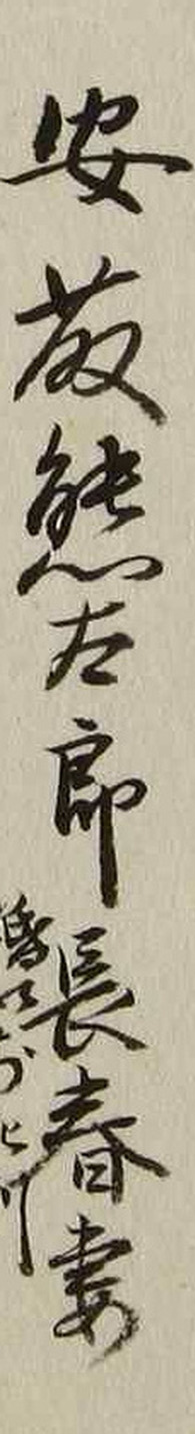女安藤熊太郎長春妻
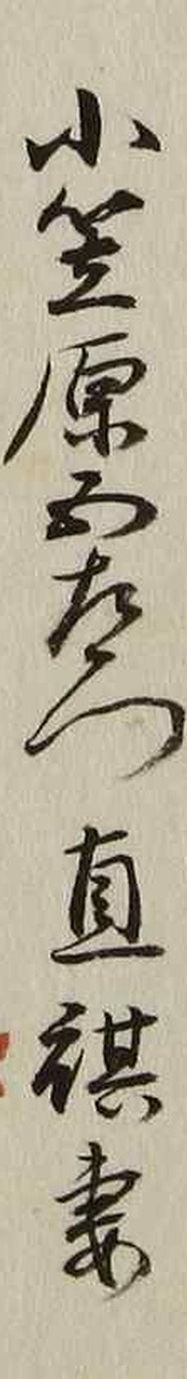小笠原五左衛門直祺妻
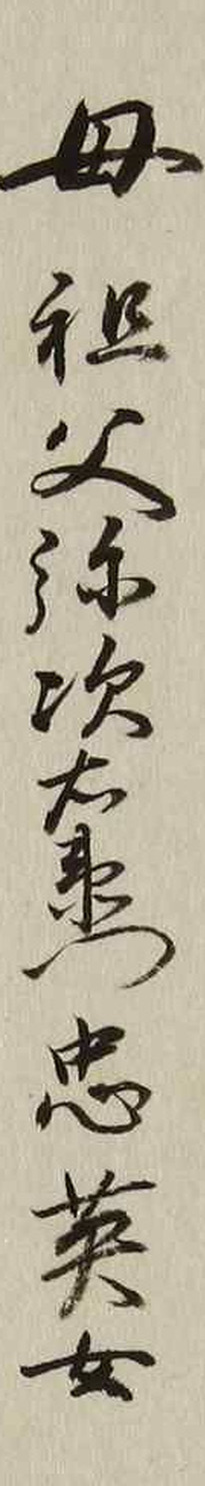母祖父弥次右衛門忠英女
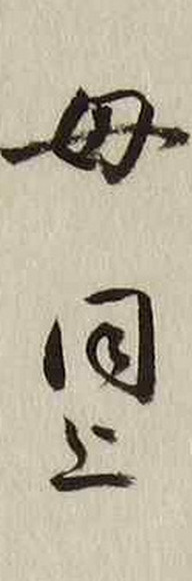母同上
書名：諸士系譜　巻之160　な之部2
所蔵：会津若松市立会津図書館
